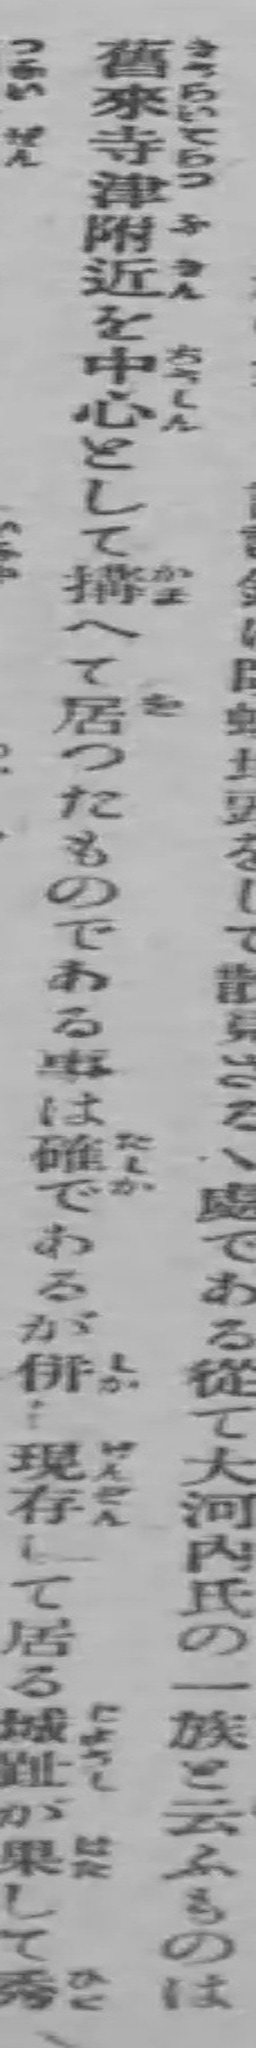旧来寺津附近を中心として構へて居つたものである事は確であるが併し現存して居る城址が果して秀
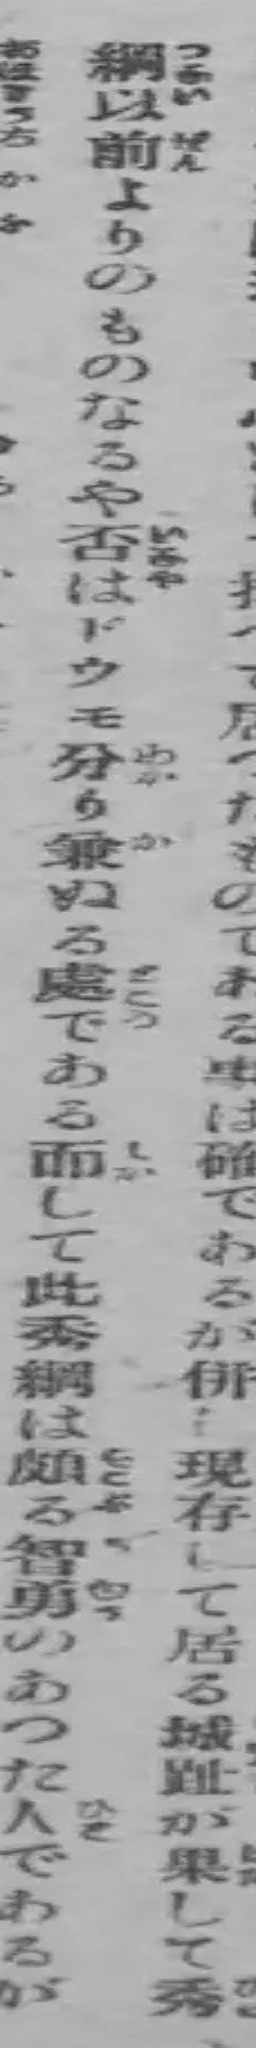綱以前よりのものなるや否はドウモ分り兼ぬる処である而して此秀綱は頗る智勇のあつた人であるが
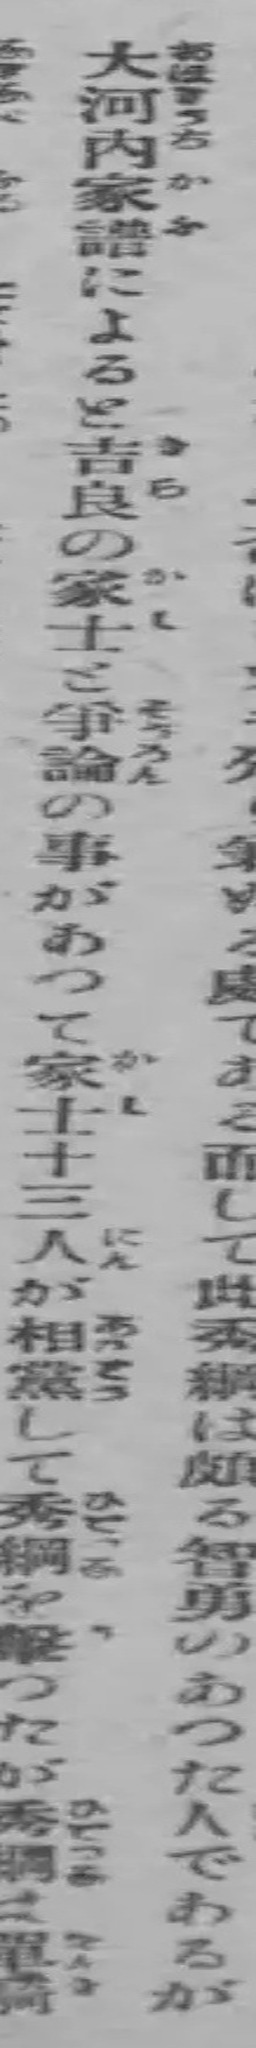大河内家譜によると吉良の家士と争論の事があつて家士十三人が相党して秀綱を襲つたが秀綱は単騎
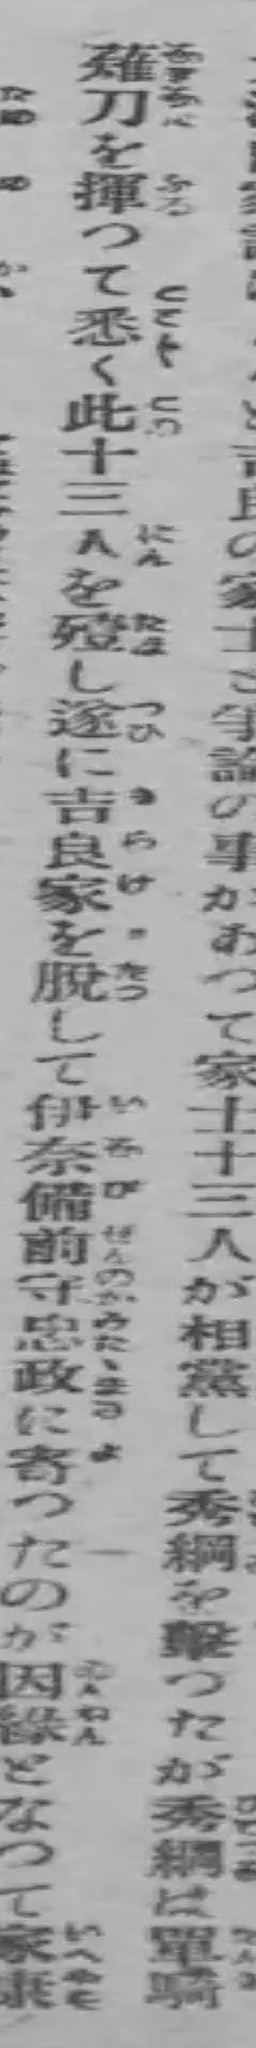薙刀を揮つて悉く此十三人を殪し遂に吉良家を脱して伊奈備前守忠政に寄つたのが因縁となつて家康
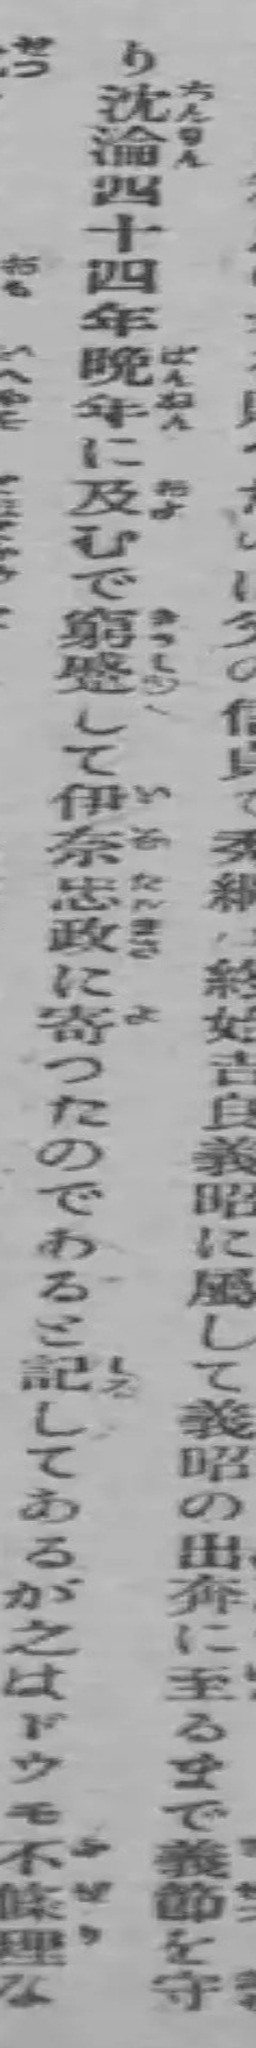り沈淪四十四年晩年に及むで窮蹙して伊奈忠政に寄つたのであると記してあるが之はドウモ不条理な
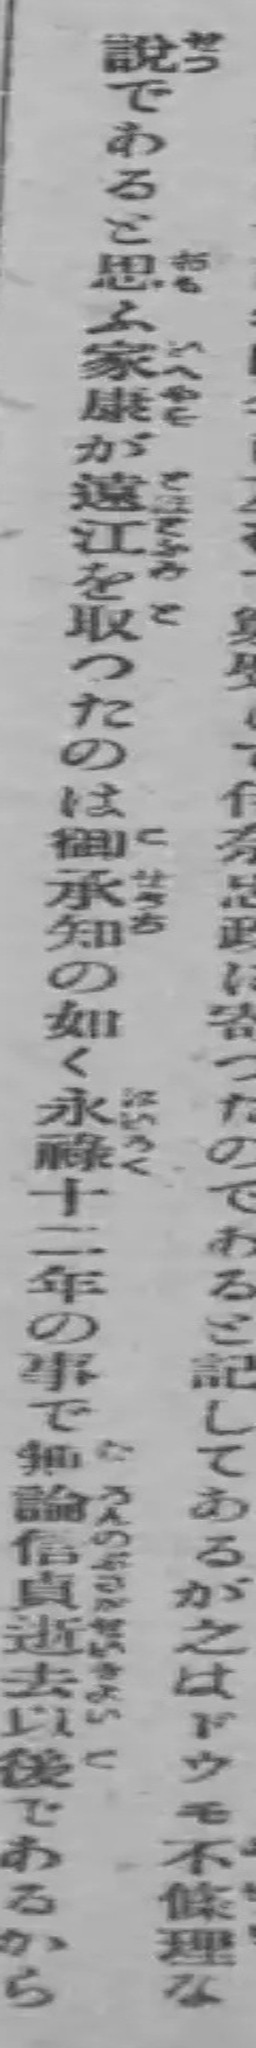説であると思ふ家康が遠江を取つたのは御承知の如く永禄十二年の事で無論信貞逝去以後であるから
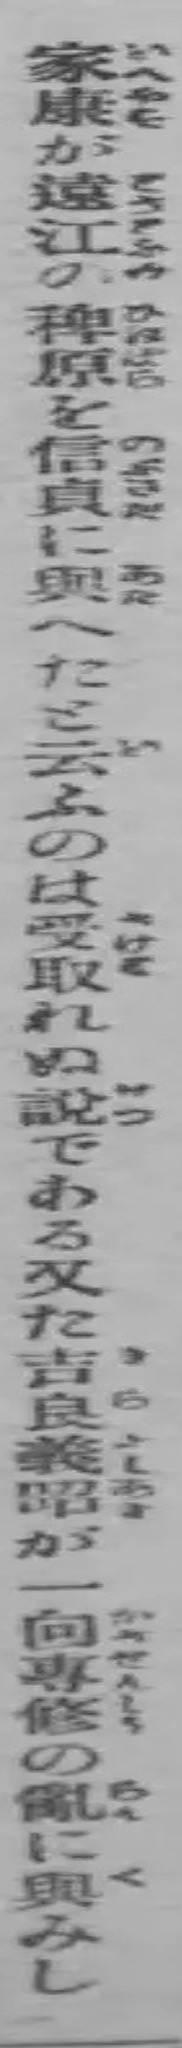家康が遠江の稗原を信貞に与へたと云ふのは受取れぬ説である又た吉良義昭が一向専修の乱に与みし
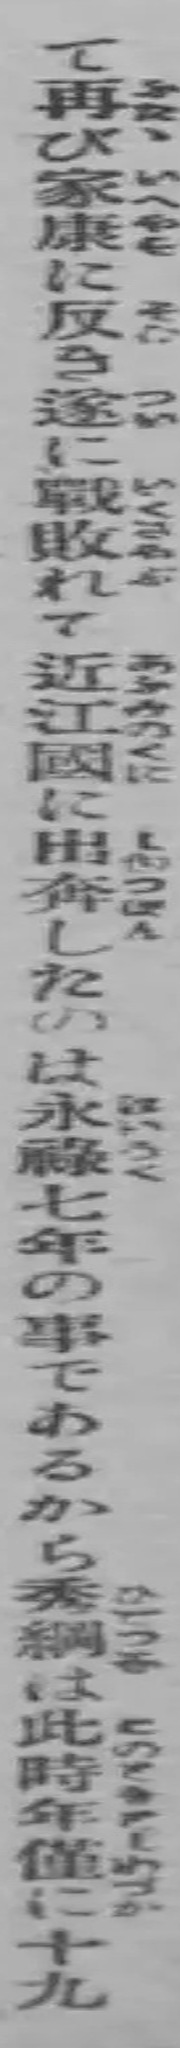て再び家康に反き遂に戦敗れて近江国に出奔したのは永禄七年の事であるから秀綱は此時年僅に十九
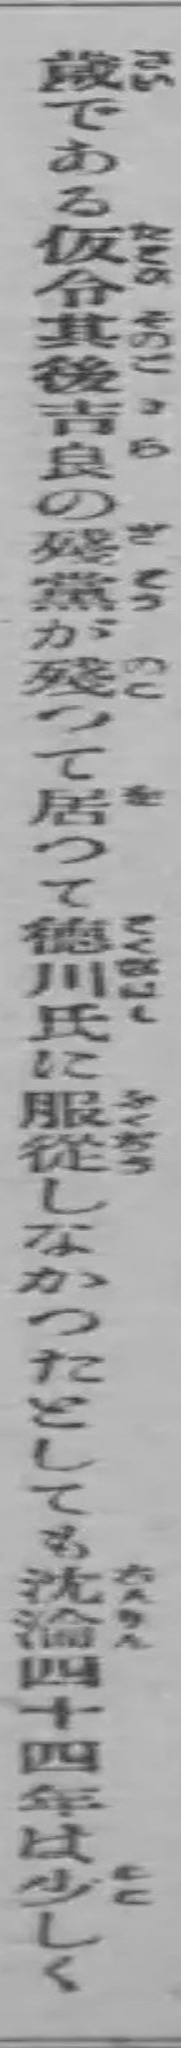歳である仮令其後吉良の残党が残つて居つて徳川氏に服従しなかつたとしても沈淪四十四年は少しく
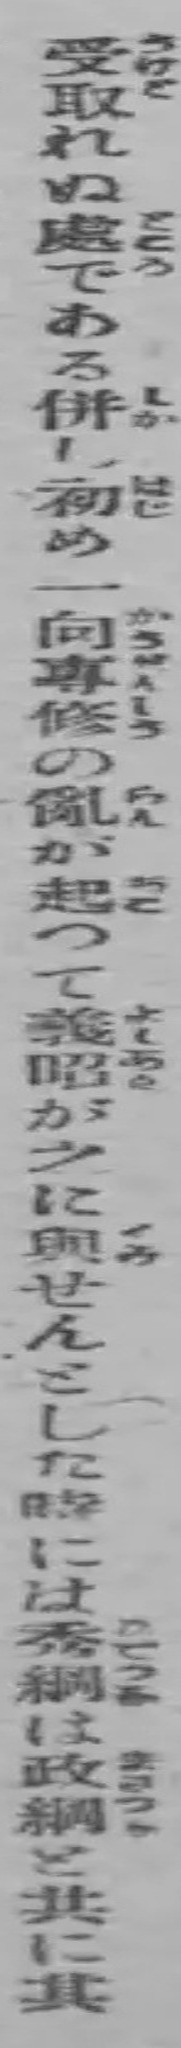受取れぬ処である併し初め一向専修の乱が起つて義昭が之に与せんとした時には秀綱は政綱と共に其
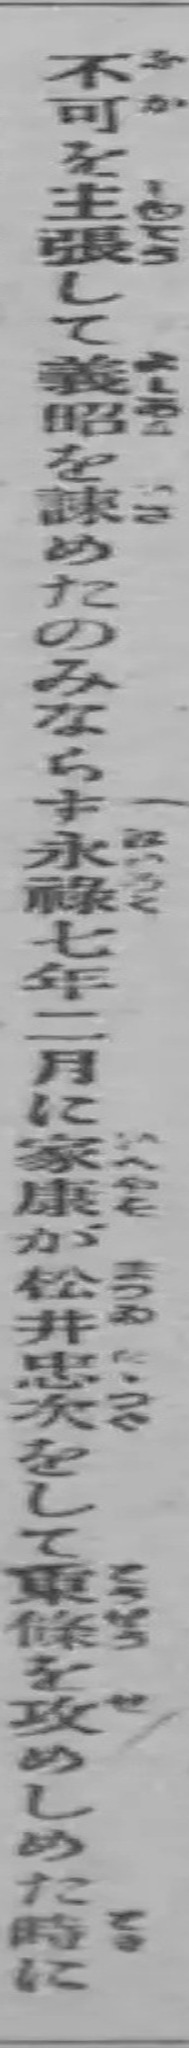不可を主張して義昭を諌めたのみならず永禄七年二月に家康が松井忠次をして東條を攻めしめた時に
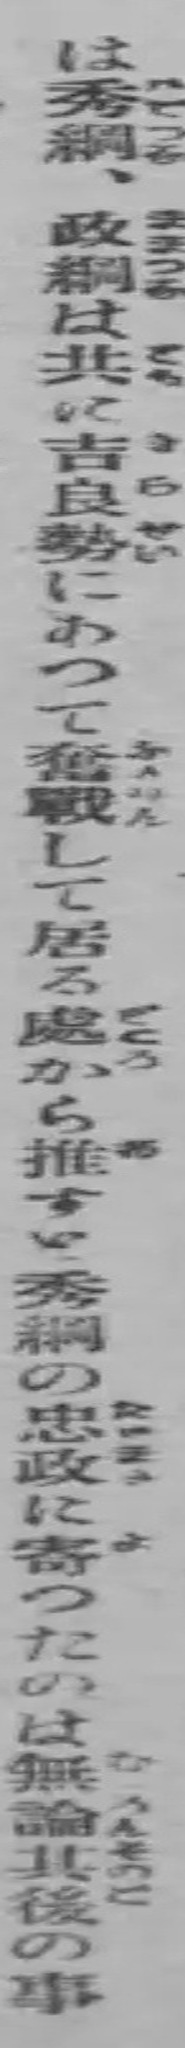は秀綱、政綱は共に吉良勢にあつて奮戦して居る処から推すと秀綱の忠政に寄つたのは無論其後の事
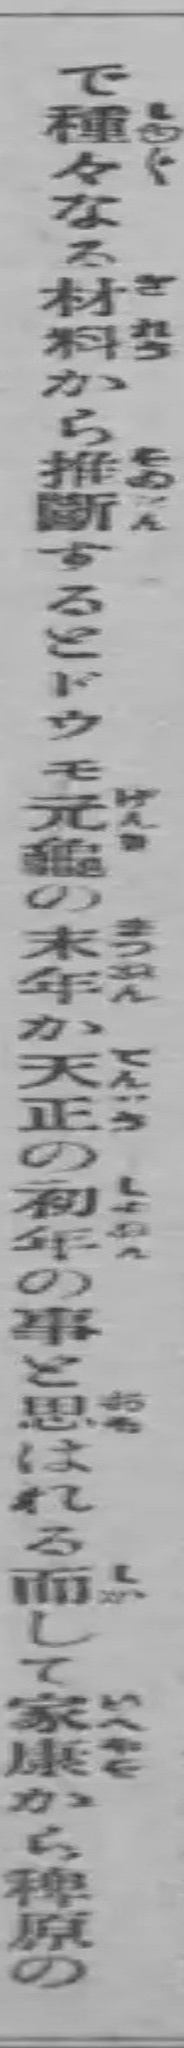で種々なる材料から推断するとドウモ元亀の末年か天正の初年の事と思はれる而して家康から稗原の
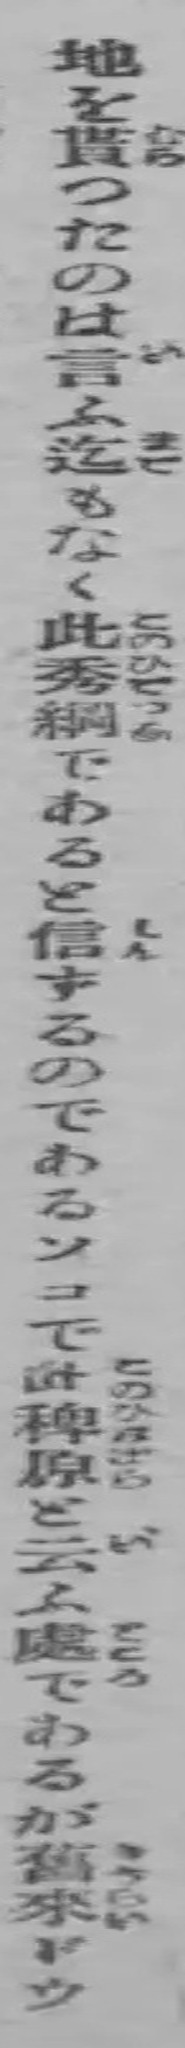地を貰つたのは言ふ迄もなく此秀綱であると信ずるのであるソコで此稗原と云ふ処であるが旧来ドウ
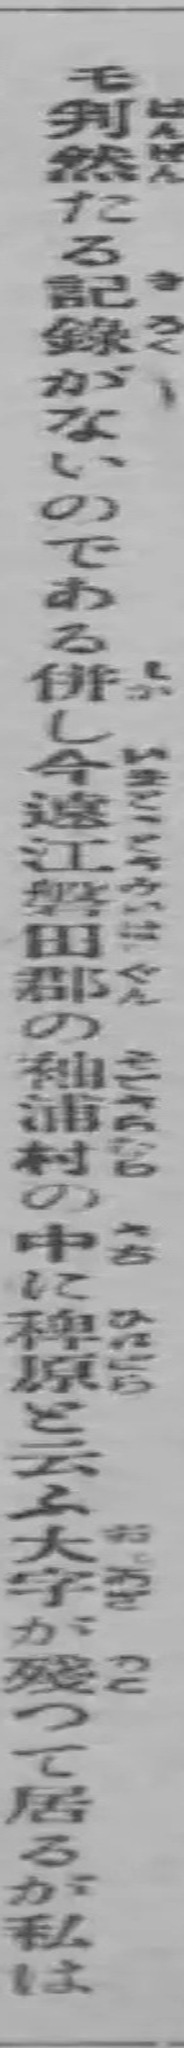モ判然たる記録がないのである併し今遠江磐田郡の袖浦村の中に稗原と云ふ大字が残つて居るが私は
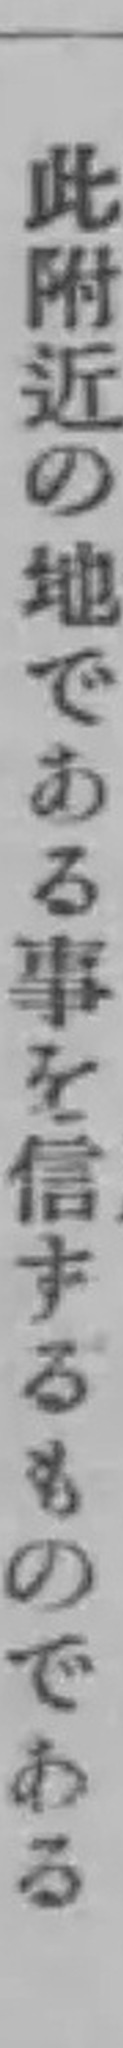此附近の地である事を信ずるものである
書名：豊橋市史談
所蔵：国立国会図書館 National Diet Library, JAPAN
